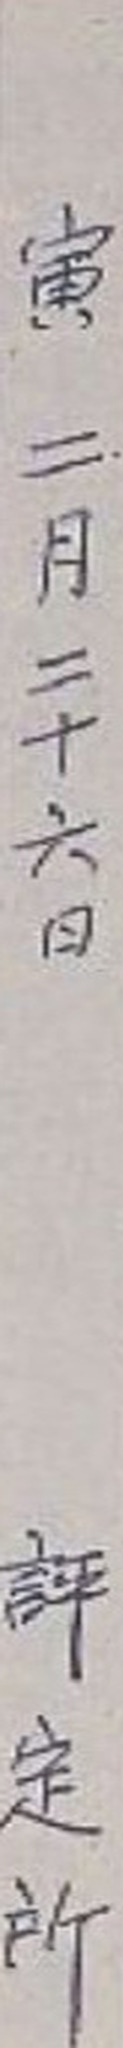寅二月二十六日評定所
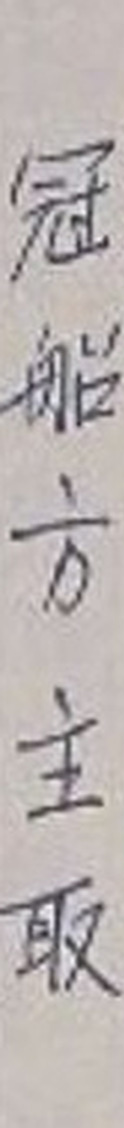冠船方主取
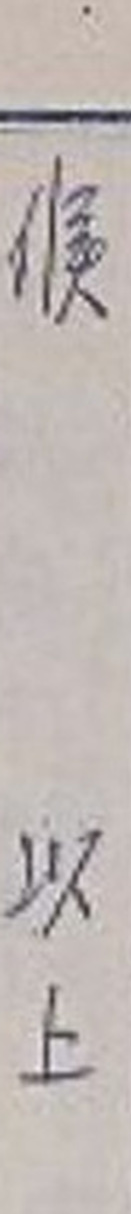候以上
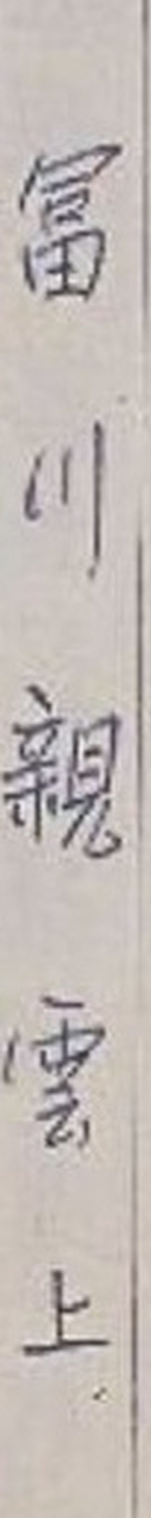冨島親雲上
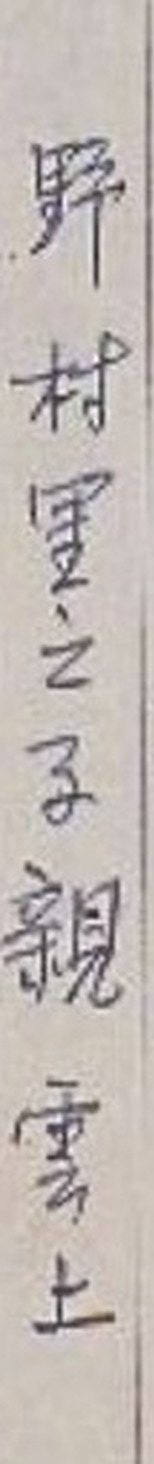野村里之子親雲上
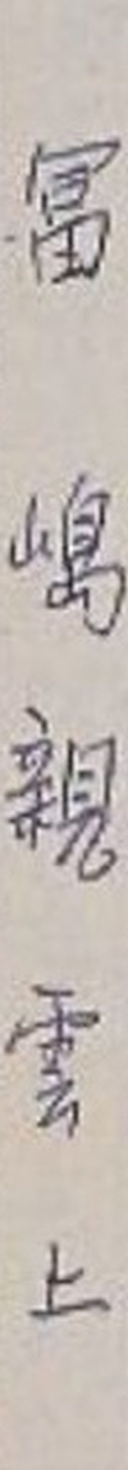冨島親雲上
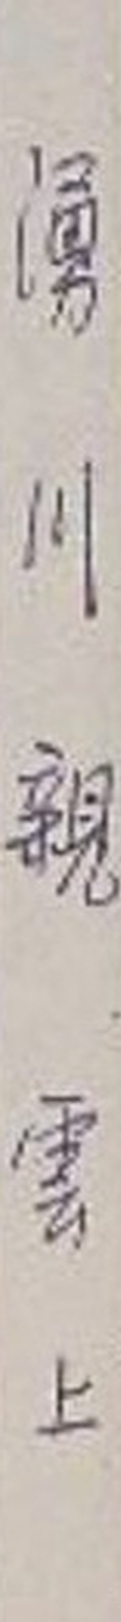湧川親雲上
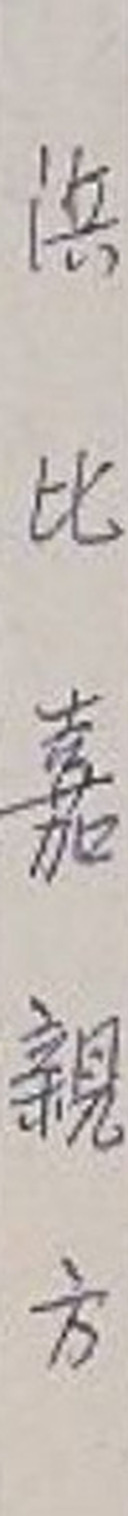浜比嘉親方
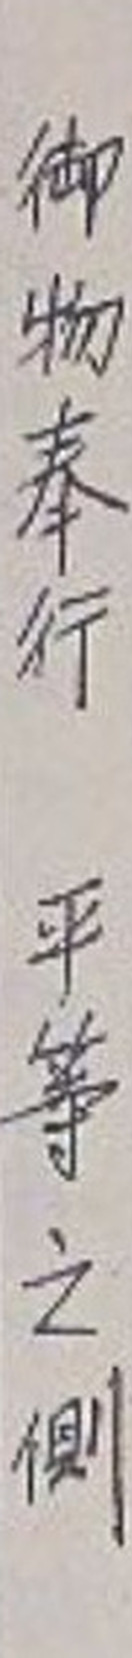御物奉行平等之側
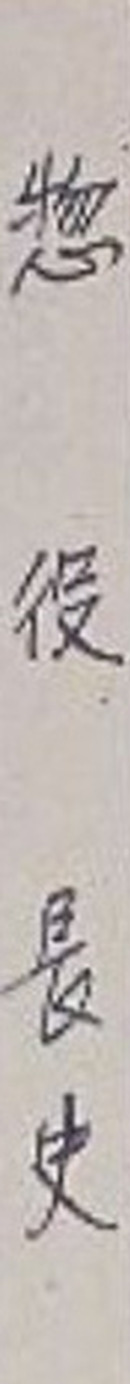惣役長史
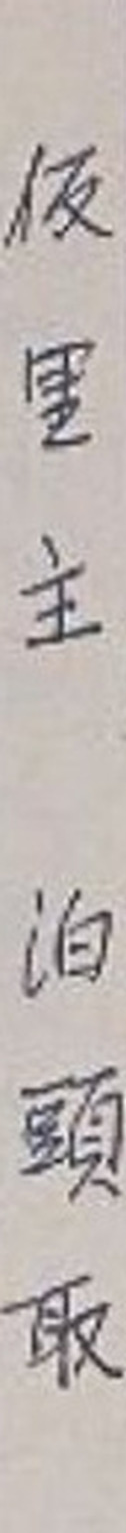仮里主泊頭取
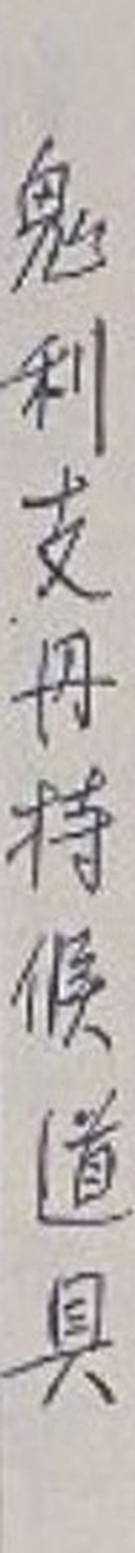鬼利支丹持候道具
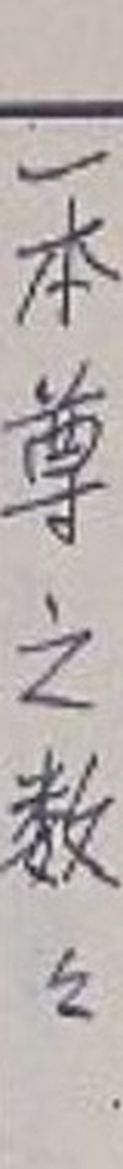一本尊之数々
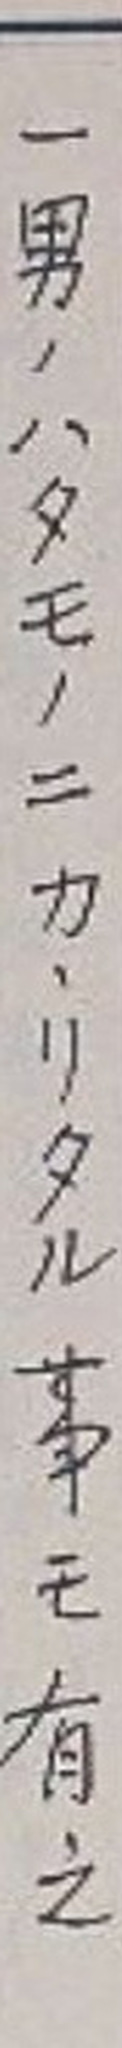一男のはたものにかゝりたる事も有之
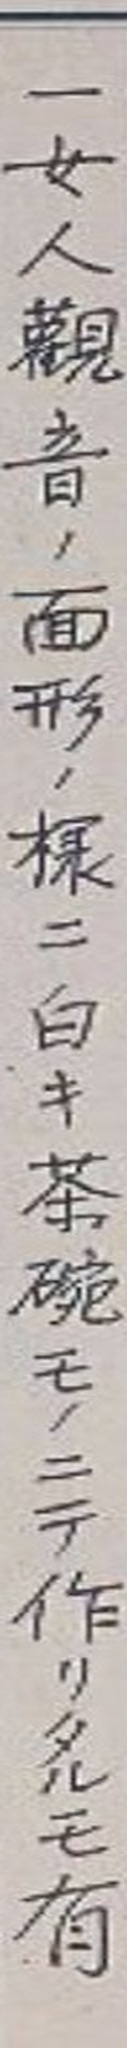一女人観音の面形の様に白き茶碗ものにて作りたるも有
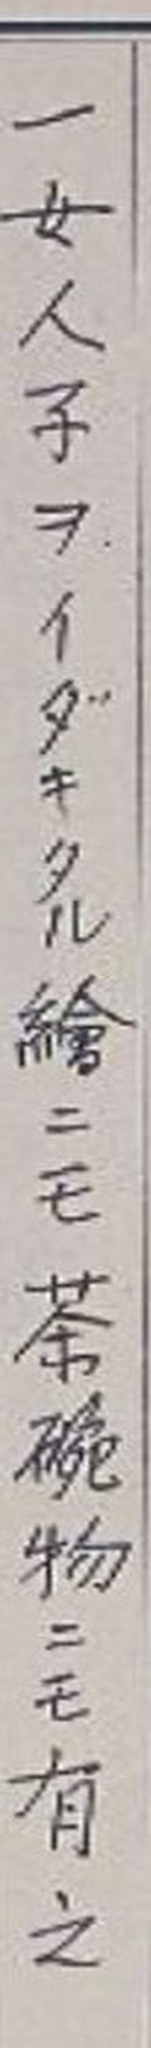一女人子をいだきたる絵にも茶碗物にも有之
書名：支那冊封使来琉諸記 下巻
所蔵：University of the Ryukyus Library
